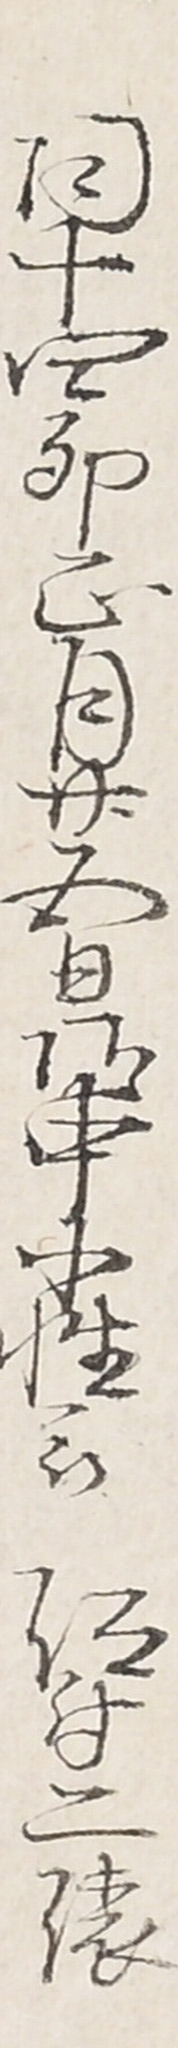一同十四卯正月廿五日御中小性被仰付二俵
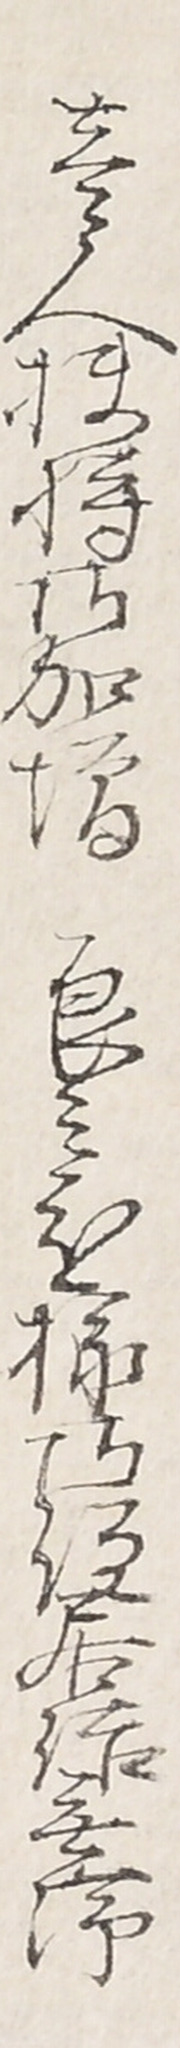壱人扶持御加増良之進様御住居詰無滞
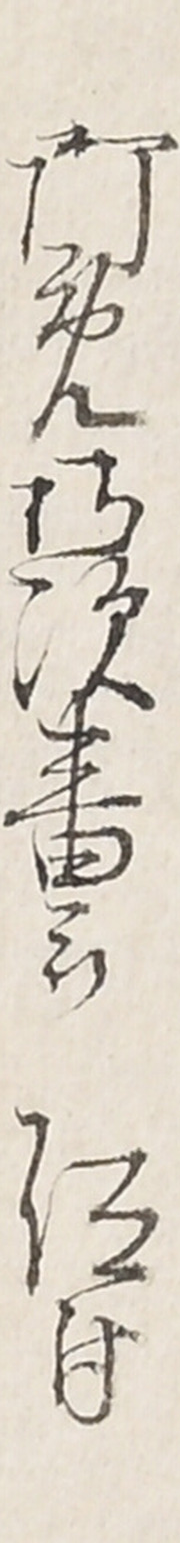御免御次番被仰付
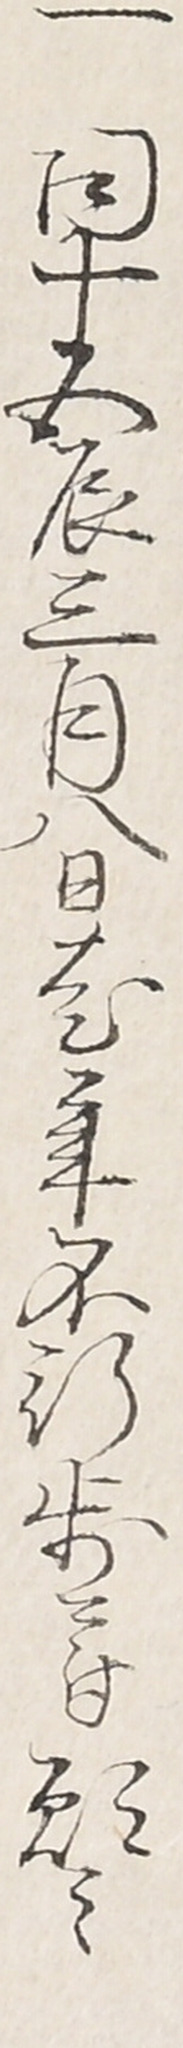一同十五辰三月八日老年不行歩ニ付願之
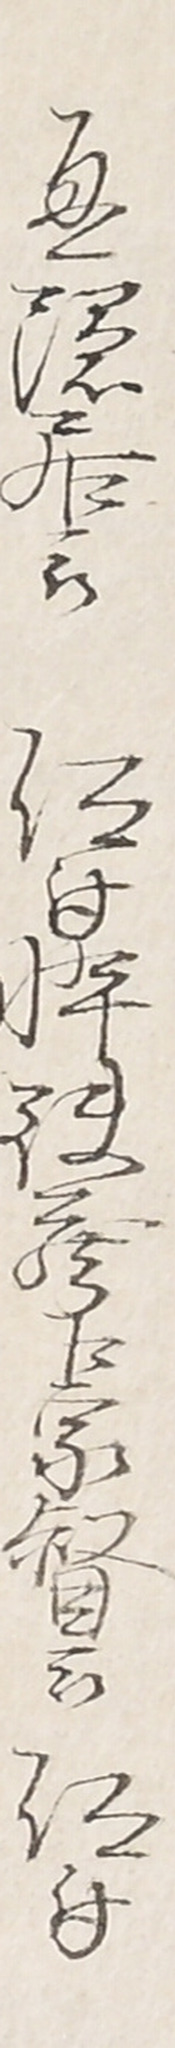通隠居被仰付忰鉄蔵江家督被仰付
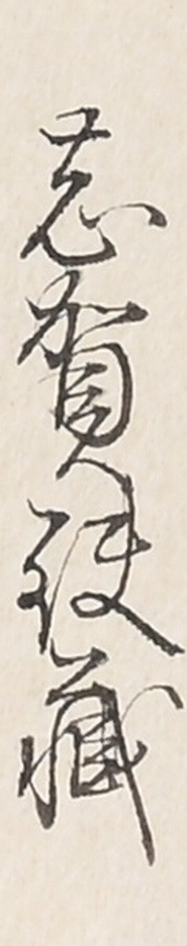志賀鉄蔵
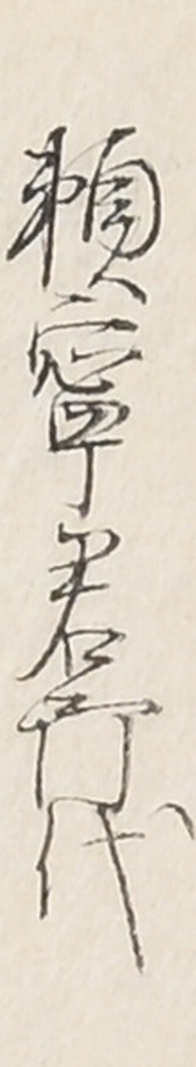頼寧君御代
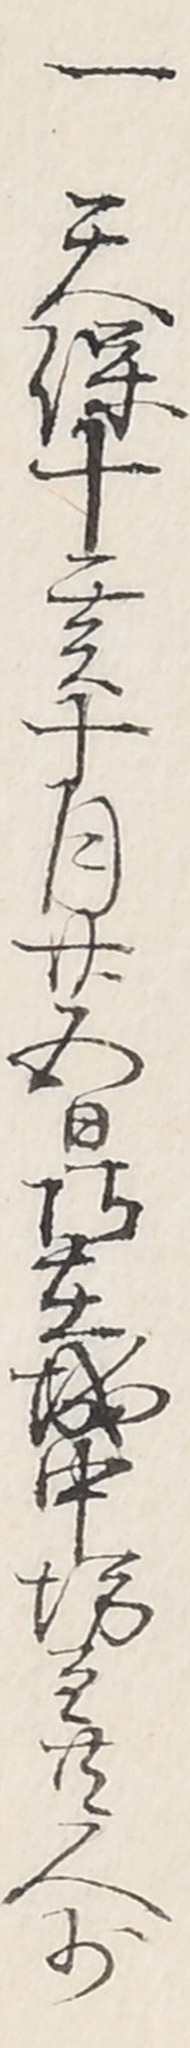一天保十亥十月廿五日御在城中坊主共人少
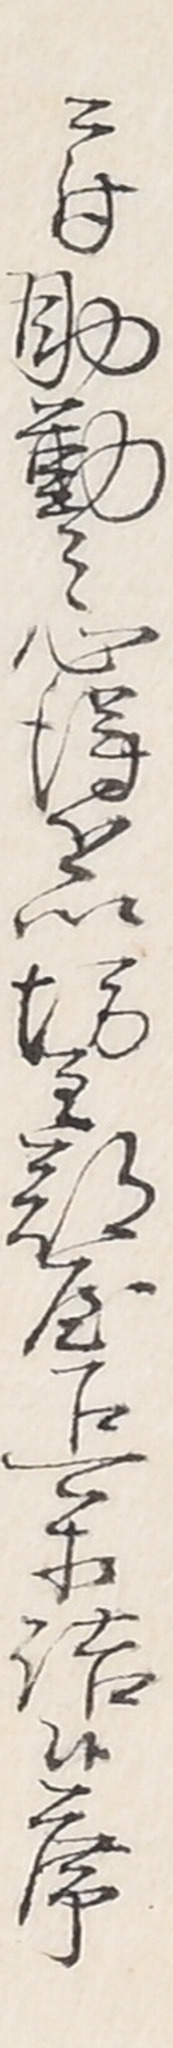ニ付助勤之心得を以坊主部屋江可相詰候席
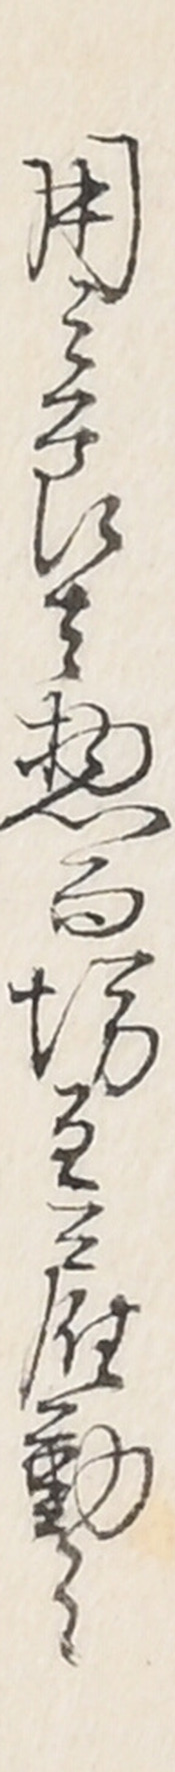用之節者惣而坊主雇勤之
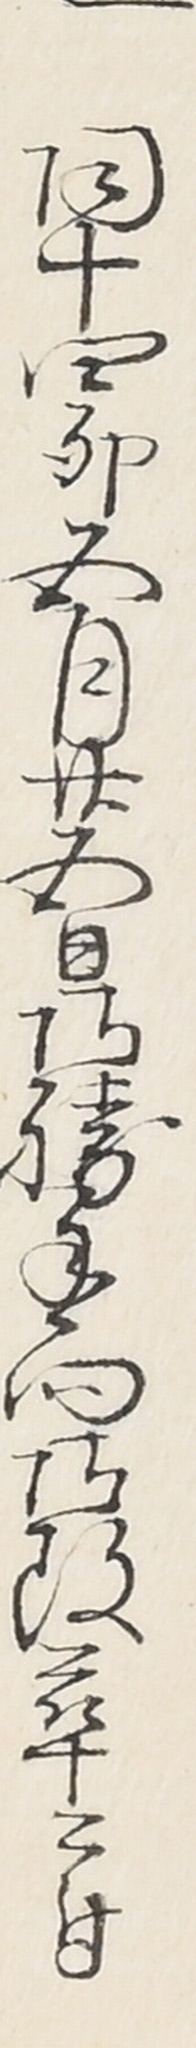一同十四卯五月廿五日御勝手向御改革ニ付
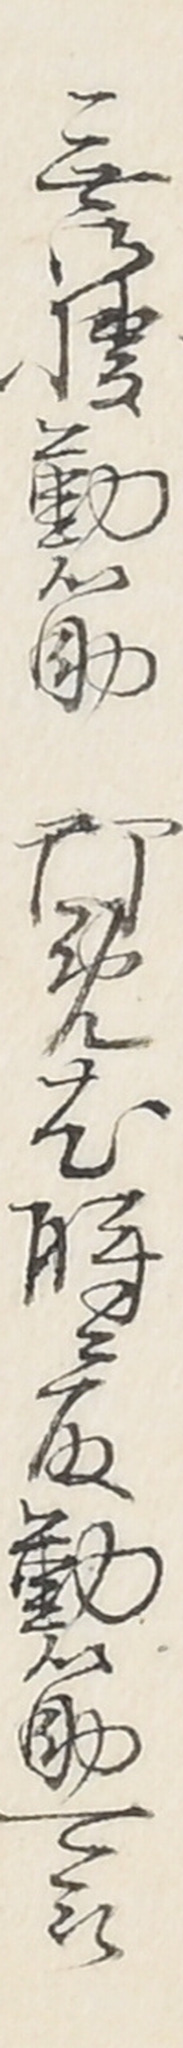無御據勤筋御免尤時ニ取勤筋可被
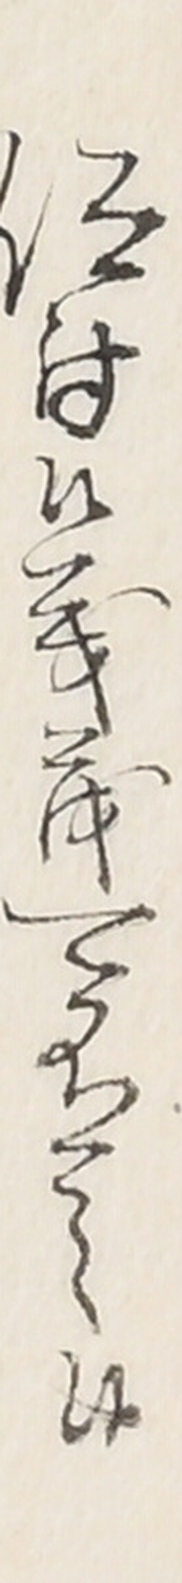仰付候義茂可有之候
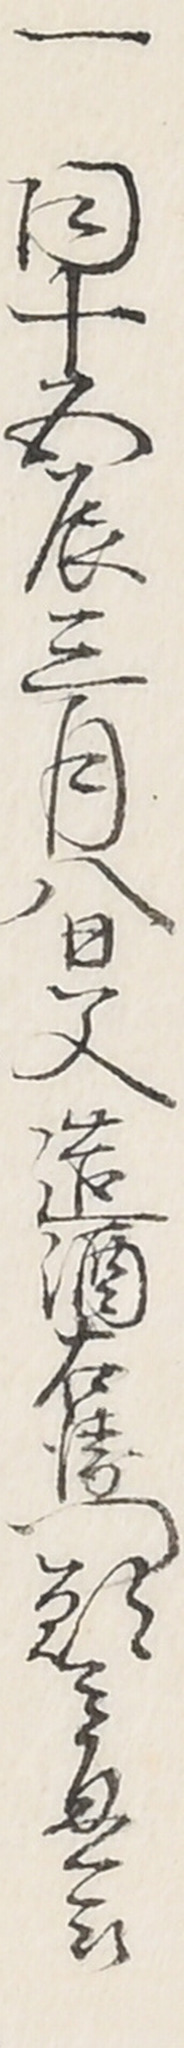一同十五辰三月八日父造酒右衛門願之通被
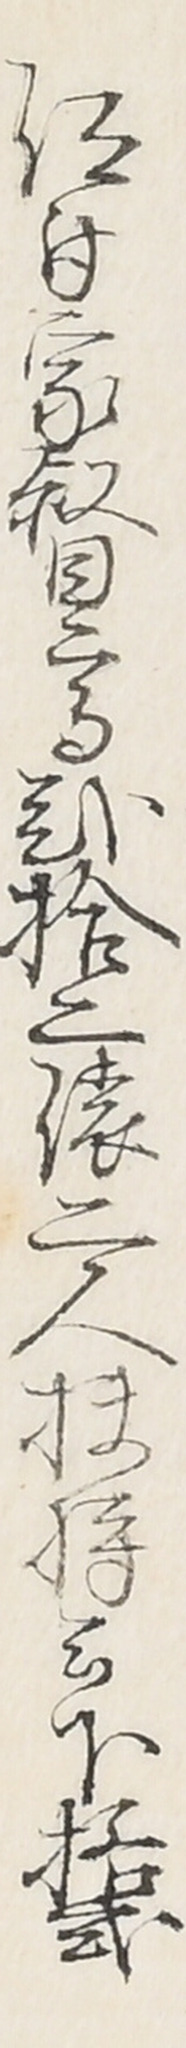仰付家督高弐拾二俵二人扶持被下格式
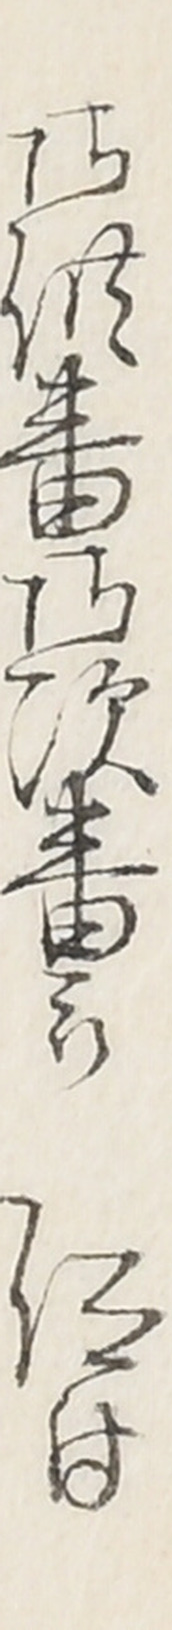御供番御次番被仰付
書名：無足諸士勤仕録（四）
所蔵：伊那市立高遠町図書館・合同会社AMANE
